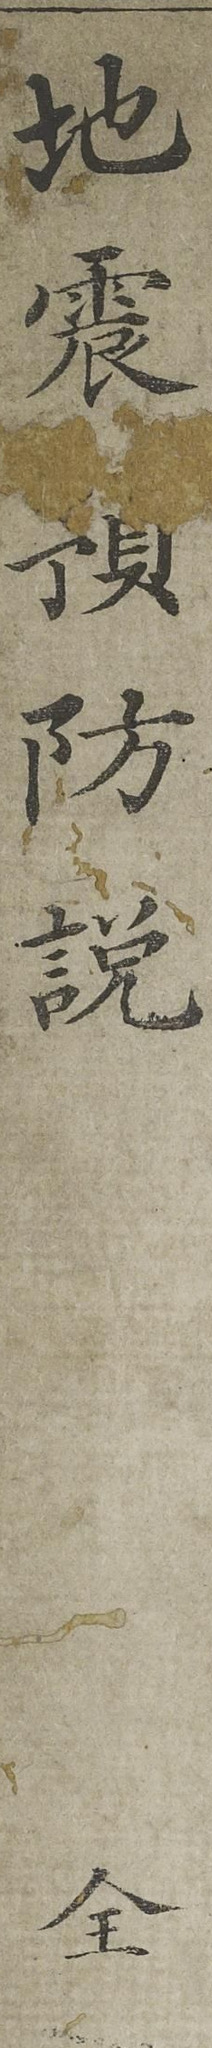地震預防説全

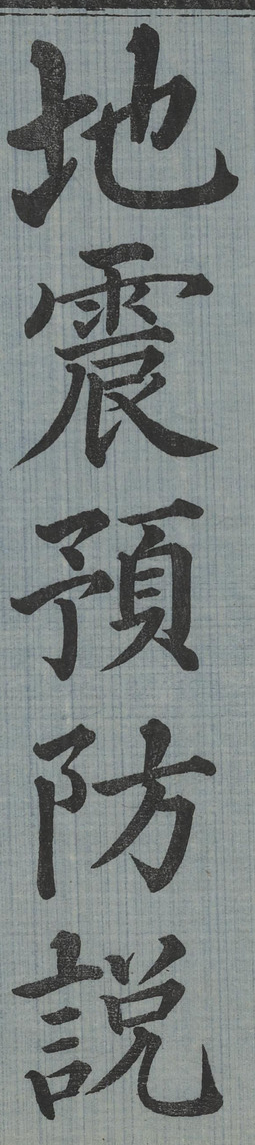地震預防説
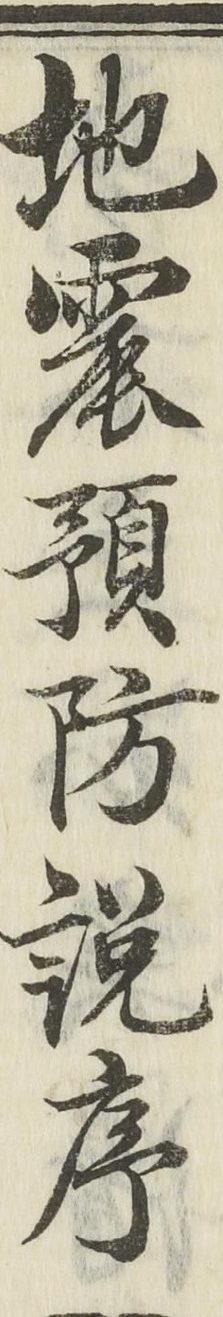地震預防説
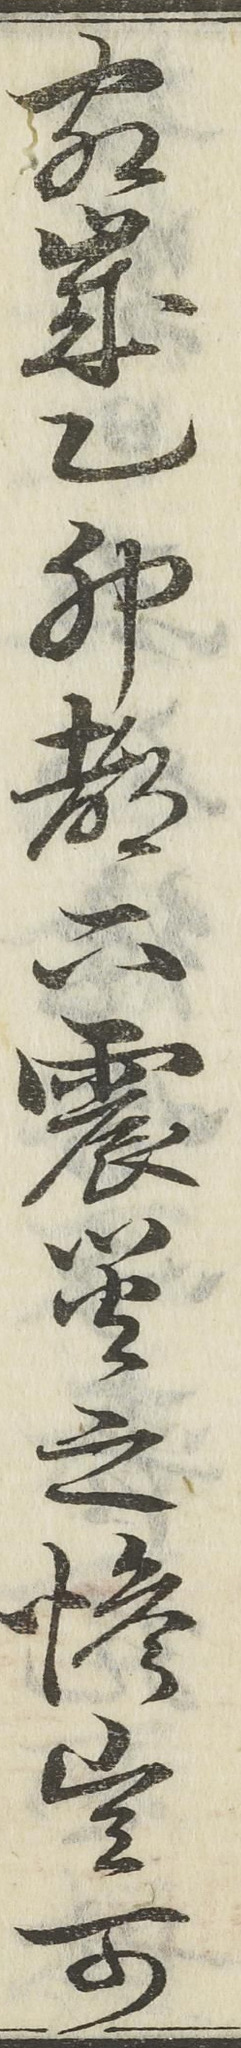客歳乙卯都下震災之惨豈可
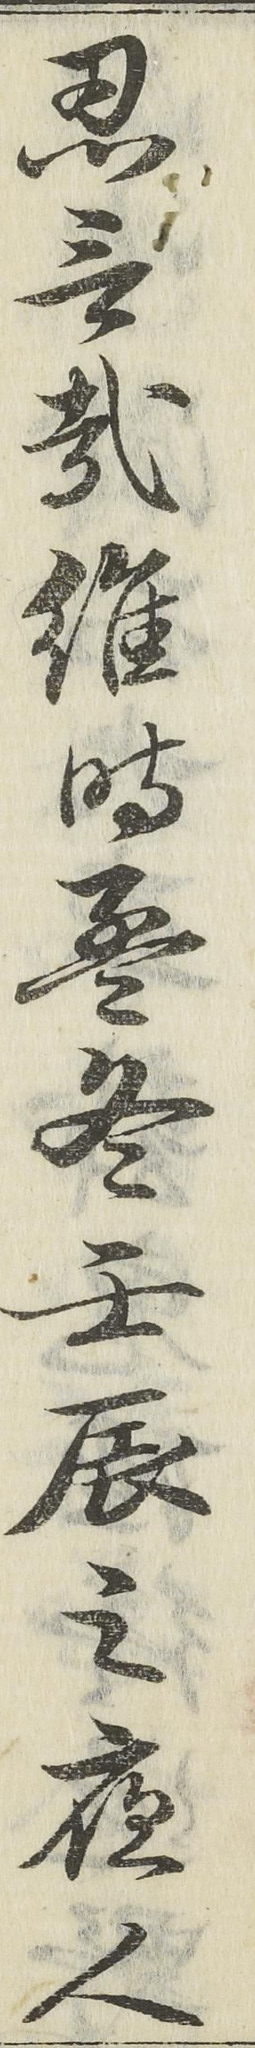忍言哉維時孟冬壬辰之夜人
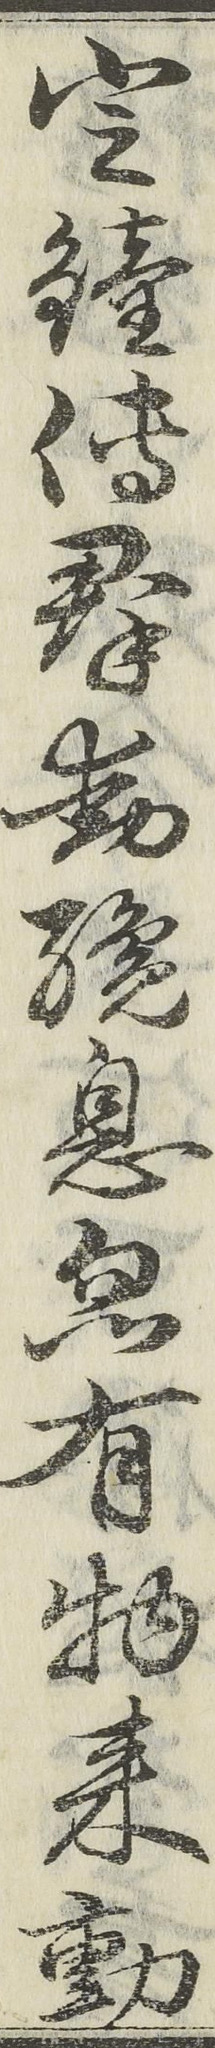定鐘伝群動纔息忽有物来動
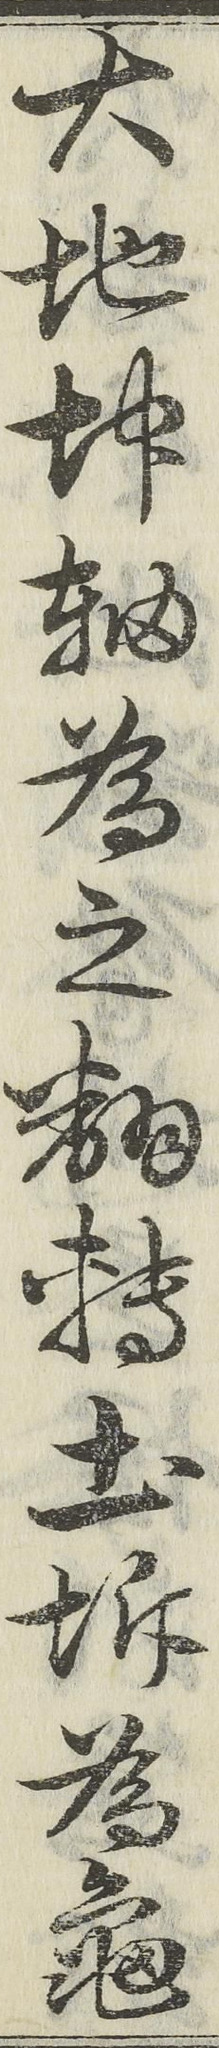大地坤軸為之翻転土坼為亀
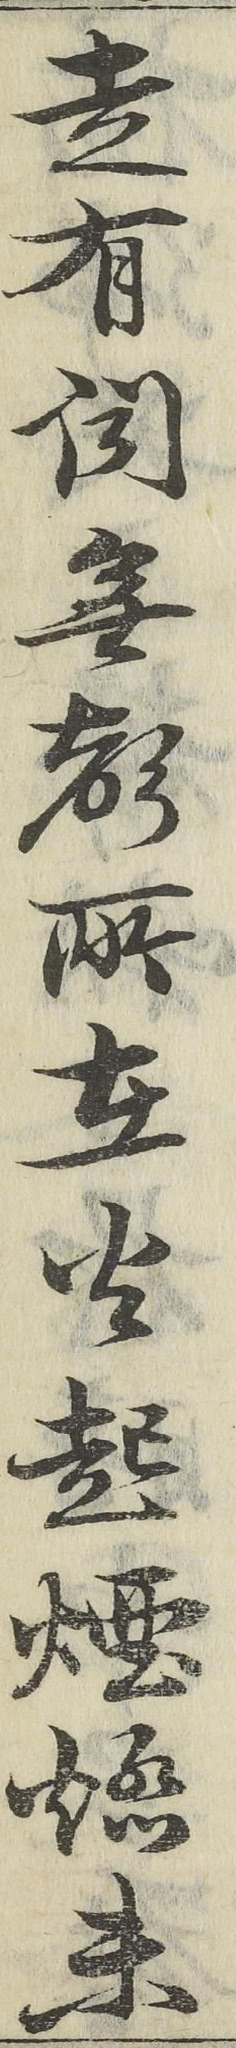走有聞無声所在炎起煙燃未

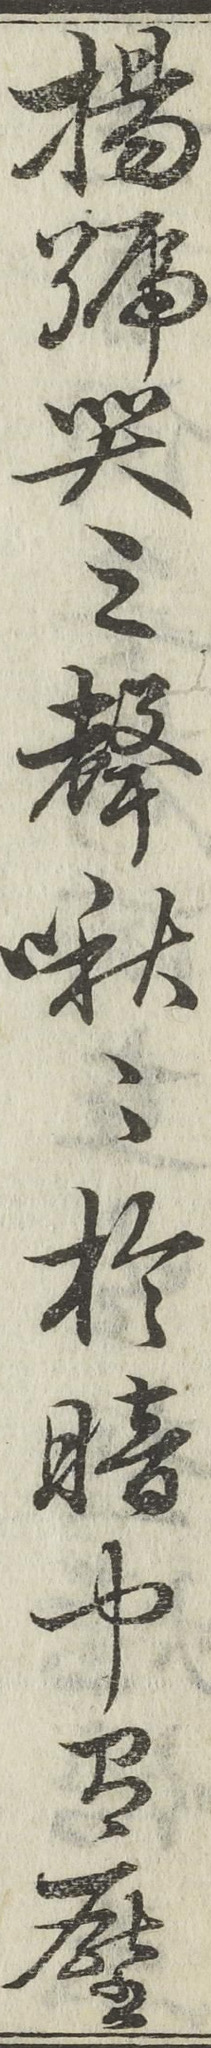揚号哭之声啾々於暗中有圧
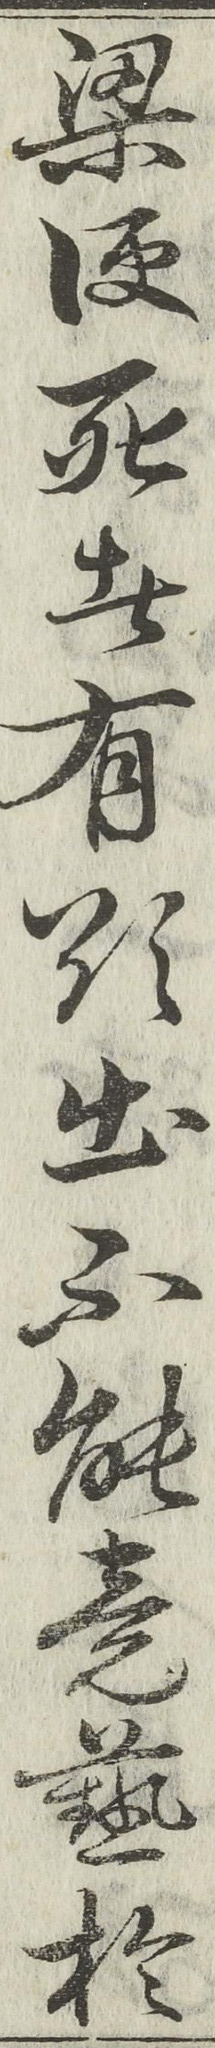梁便死者有欲出不能走爇於
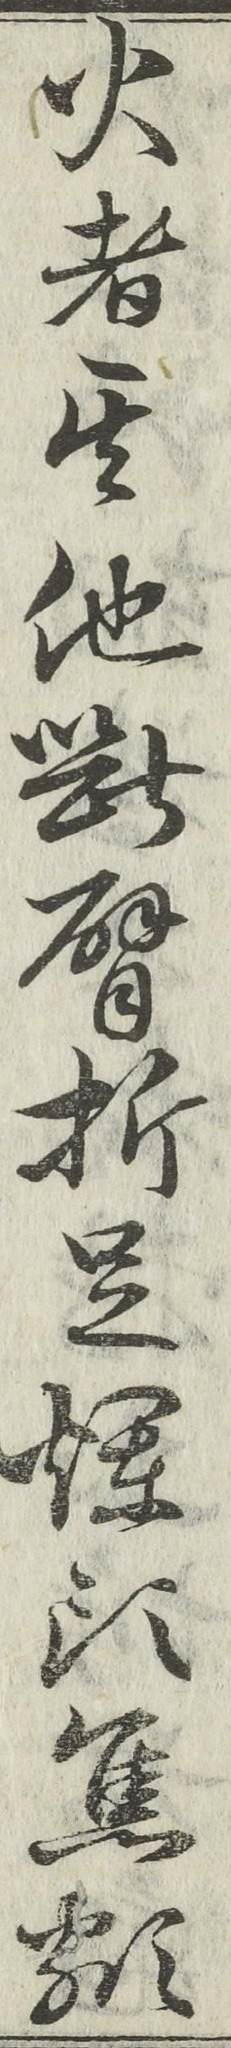火者其他断臂折足爛頭焦額
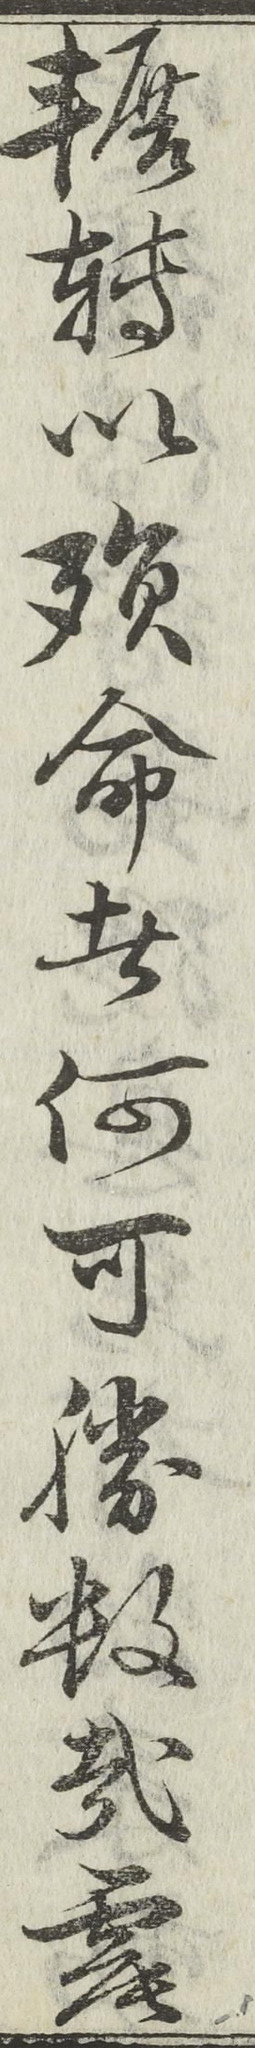輾転以殞命者何可勝数哉震
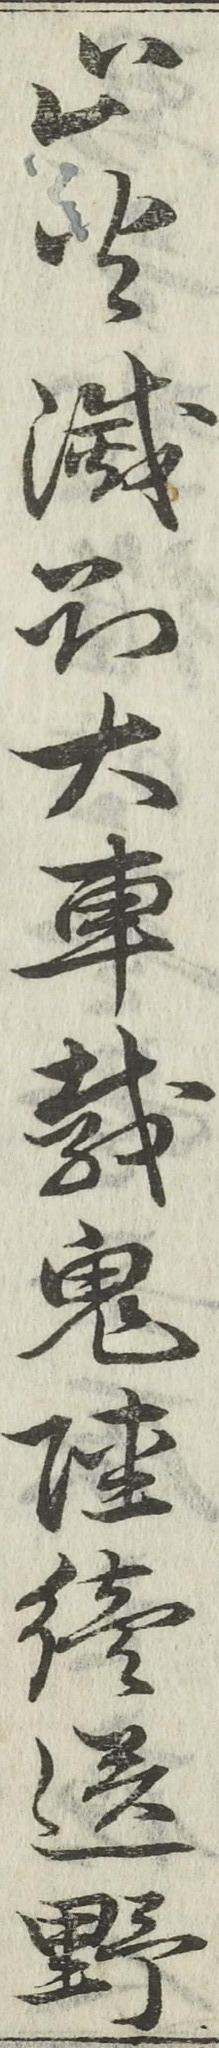止火滅則大車載鬼陸続送野
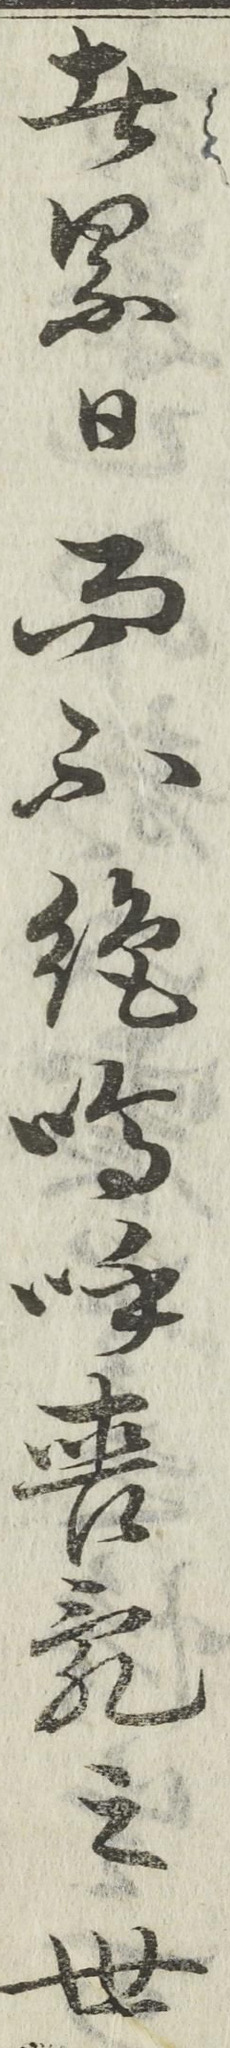者累日而不絶嗚呼喪乱之世
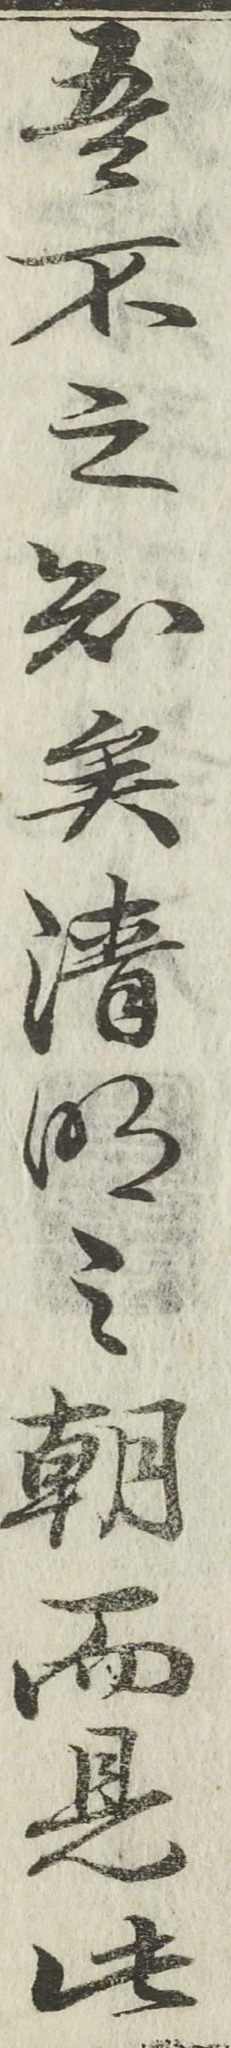吾不之知矣清明之朝而見此
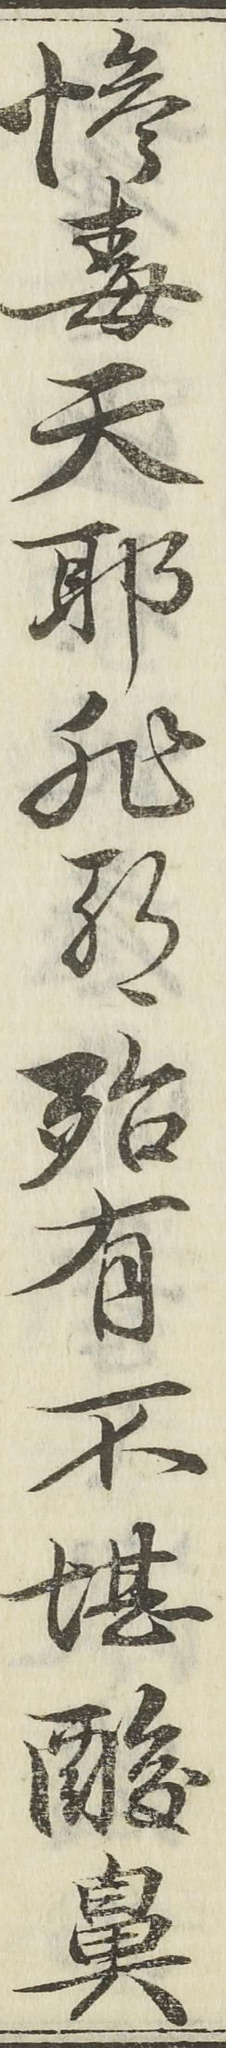惨毒天耶非耶殆有不堪酸鼻
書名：地震預防説
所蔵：東京大学地震研究所図書室 Earthquake Research Institute Library, The University of Tokyo, JAPAN
